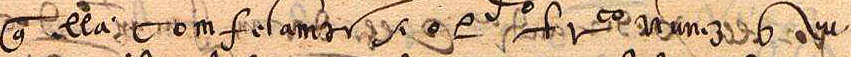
q̄ ella comfesamte e o Ldo frco nūnez seu
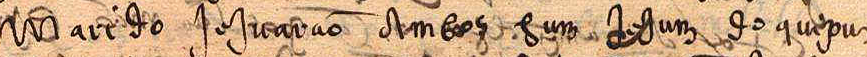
marido JeJuaraõ Ambos hum JeJum do quipur
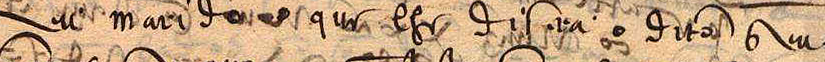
seu marido o que lhe dizia o ditō seu
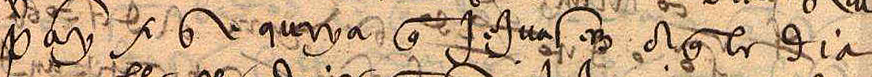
pāy e se querya q̄ JeJuasem Aq̄le dia
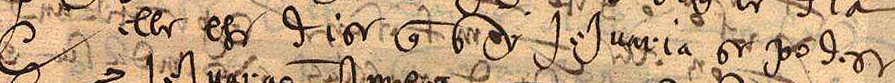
e elle lhe dise q̄ sy JeJuaria se podese
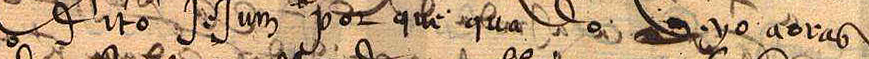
o dito JeJum por que quādo veyo a oras
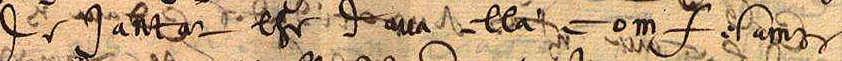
de Jantar lhe daua ella comfesamte
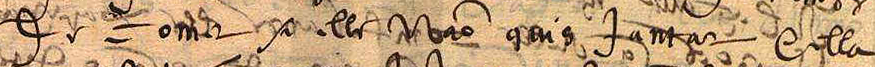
de comer e elle não quis Jantar e ella
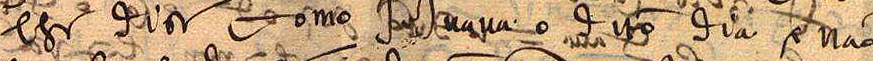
lhe dise como JeJuaua o ditō dia e naõ
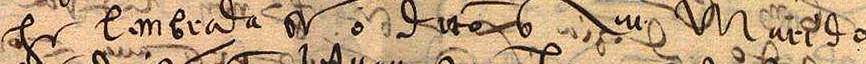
he lembrada se o ditō seu Marido
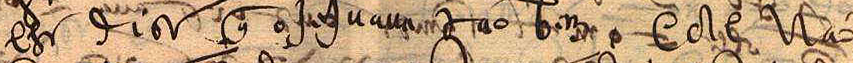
lhe dise q̄ o JeJuaua tãobem, e Al Naõ
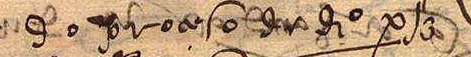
do proceso de dio pjz̄
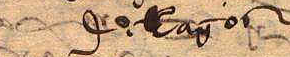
do lagos
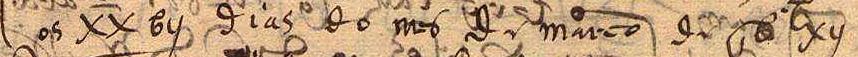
Aos XXbij dias do mes de marco de jbclxij
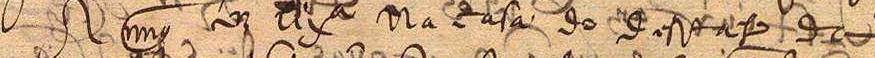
Annꝯ en lixa na casa do despacho da
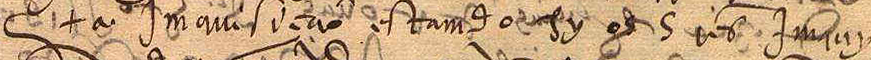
Sta Jmquisiçaõ estamdo hy os srēs Jmquy
